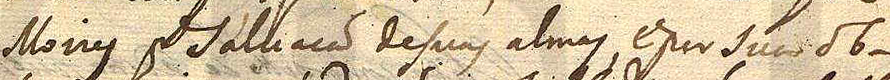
Moizes pa saluaçaõ de suas almas, E por sua ob
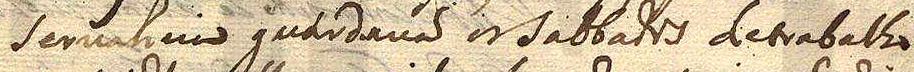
seruancia guardauaõ os sabbados de trabalho
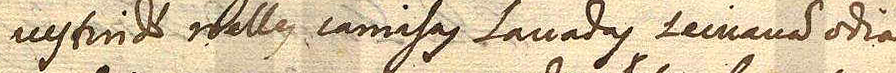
uestindo nelles camisas Lauadas ieiuauaõ o dia
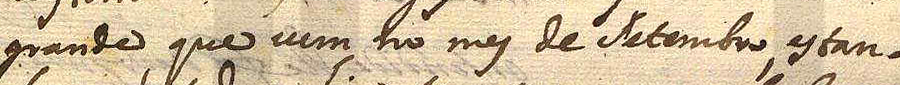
grande, que uem no mes de Setembro, estan
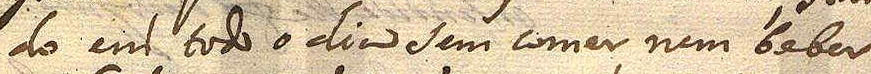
do em todo o dia sem comer nem beber
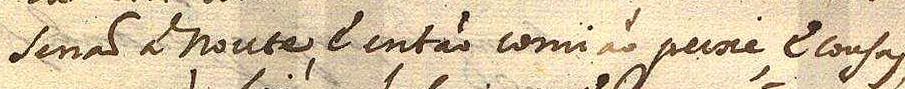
senaõ á noute, e entaõ comião peixe, e cousas
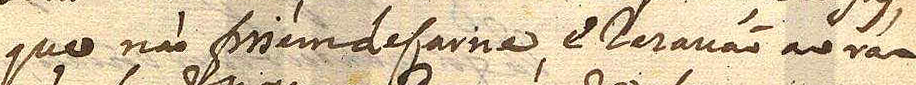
que não fossem de Carne, e Rezauaõ a ora
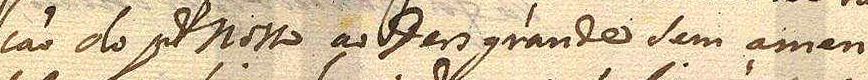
ção do pe nosso ao Deos grande sem amen
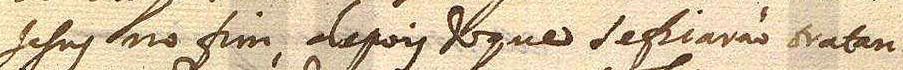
Jesus no fim, depois do que se ficaraõ tratan
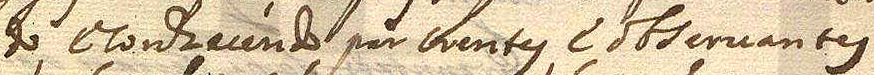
do, E conhecendo por crentes, e obseruantes
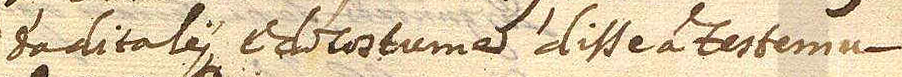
da dita lej, E do costume disse a testemu
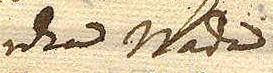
nha nada
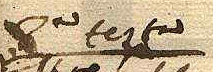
8a testa
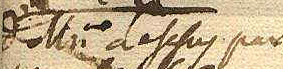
D Mna de jesus par
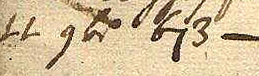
11 9bro 673 -
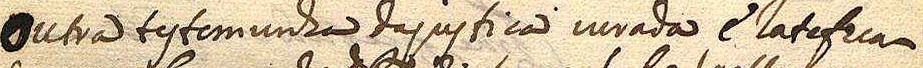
Outra testemunha da justiça iurada, e Ratefica
